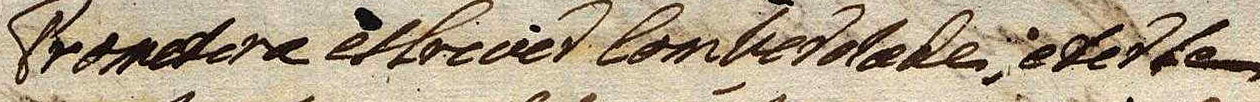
Prometera esCrever Com verdade, e ter se
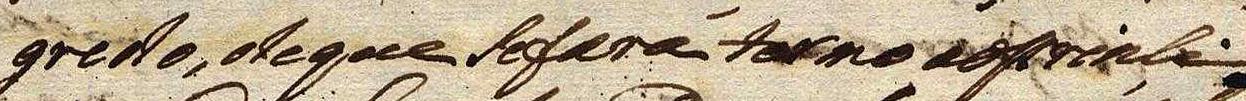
gredo, de que se fará termo ao prinÇi
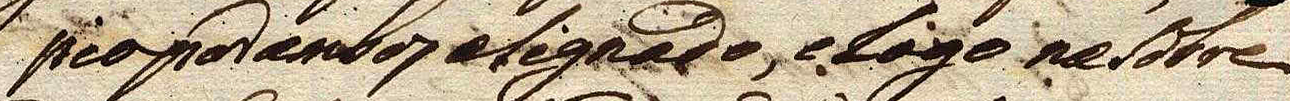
pio por ambos asignado, e Logo na sobre
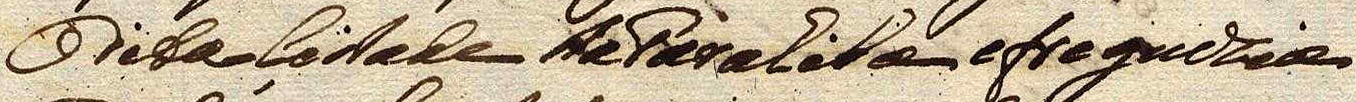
dita Çidade da Parahiba e freguezia
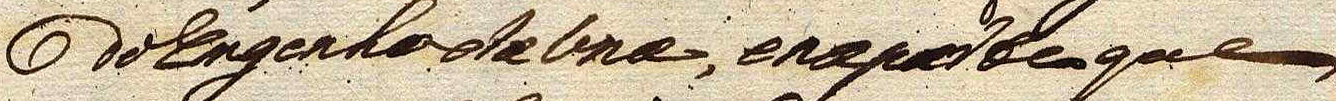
do Engenho da vna, e na parte que
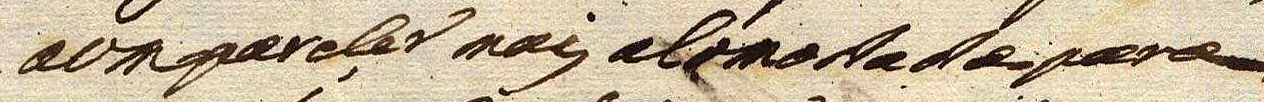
a vm pareÇer mais acomodada para
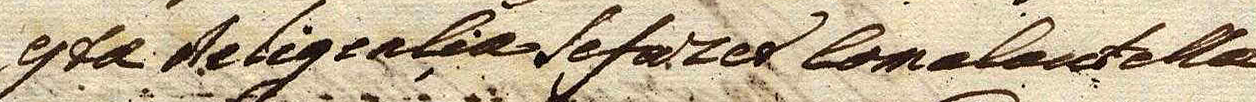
esta deligenÇia se fazer com a Cautella
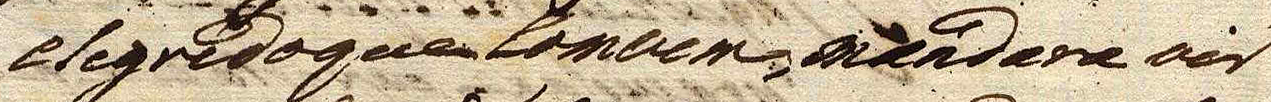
e segredo que comvem, mandara vir
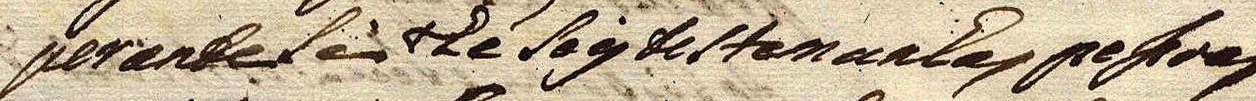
perante si thé seis testemunhas pessoas
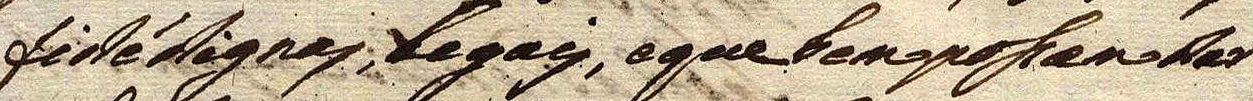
fidédignas, Legais, e que bem possam dar
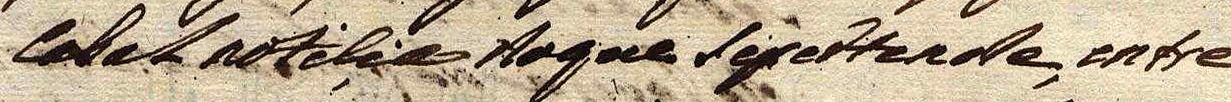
cabaL notiÇia do que se pertende, entre
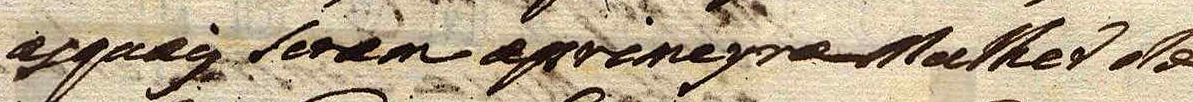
os quais seram a primeyra mulher do
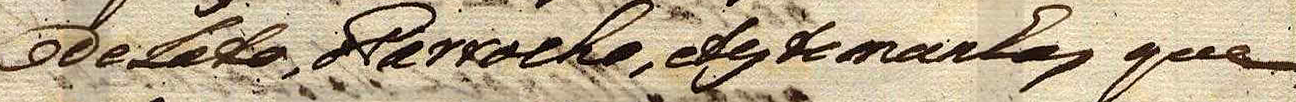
deLato, o Parrocho, e testemunhas que
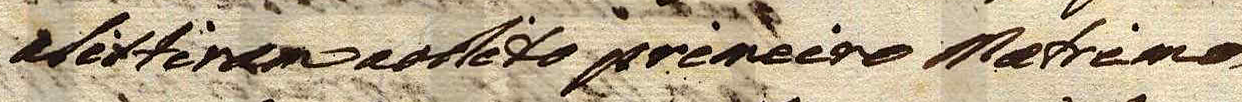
asistiram ao dito primeiro Matimo
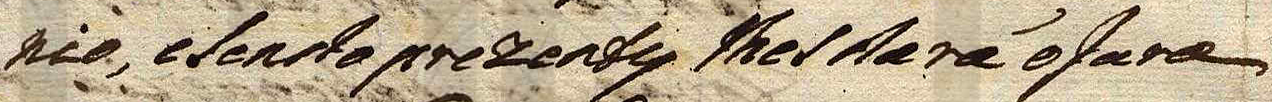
nio, e sendo prezentes lhes daraõ Jura
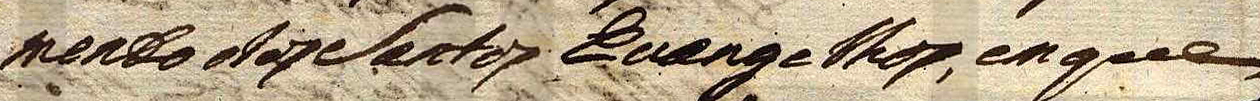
mento dos Santos Evangelhos, em que
